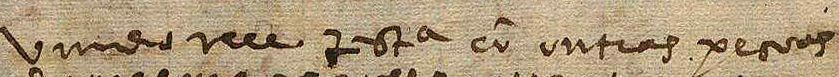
vindo elle testa cō outras pesoas
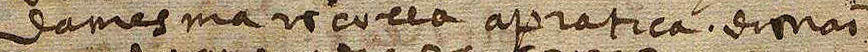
da mesma escolla a pratica . diseraõ
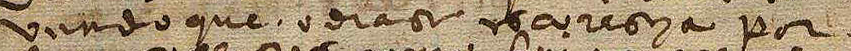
vendo que o dia se escoresya por
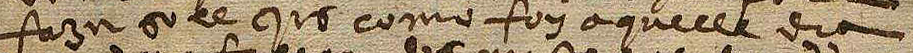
fazer soll cris como foy aquelle dia
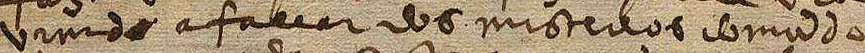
vimdo a fallar dos mistereos do mūdo
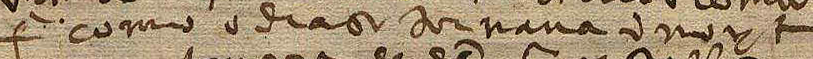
E como o dia se tornaua ē noyte
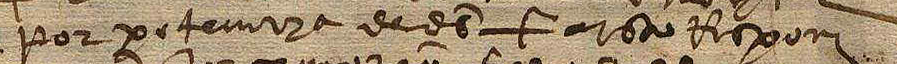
por potemcja de ds̄ E a jsto Respom
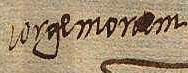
iorge moram
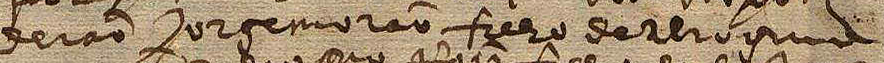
deraõ Jorge moraõ filho de dioguo
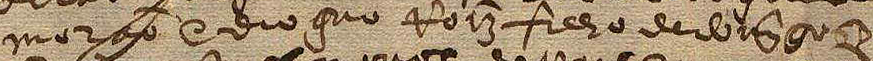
moraõ e dioguo Roiz̄ filho de domj̄guos
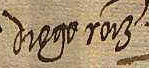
diogo roiz̄.
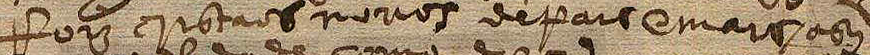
Roiz cristaos nouos de pais e mais / asy
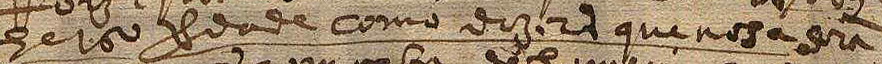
he jso ꝟdade como dizerē que nosa sorā
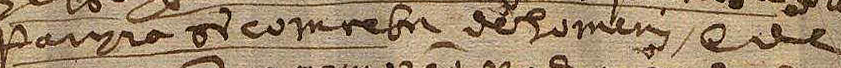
paryra sē comceber de homem / e de
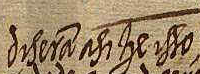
diserā asi he isso,
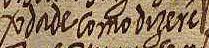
ꝟdade como dizerē
